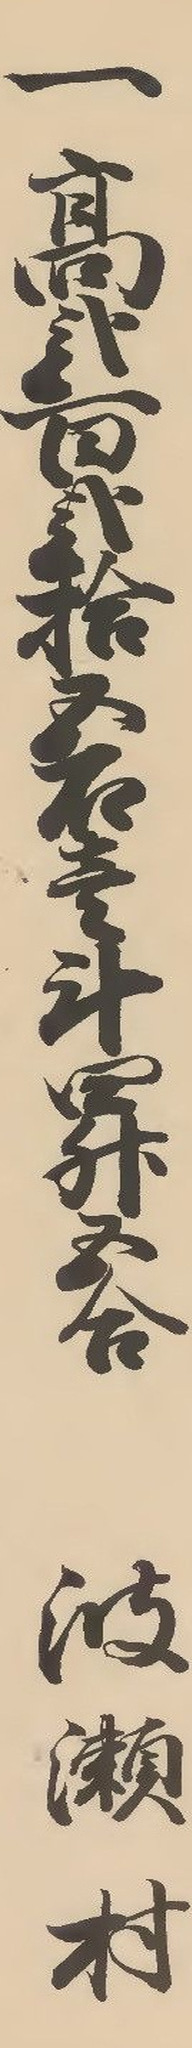一髙弐百弐拾五石壱斗四升五合波瀬村
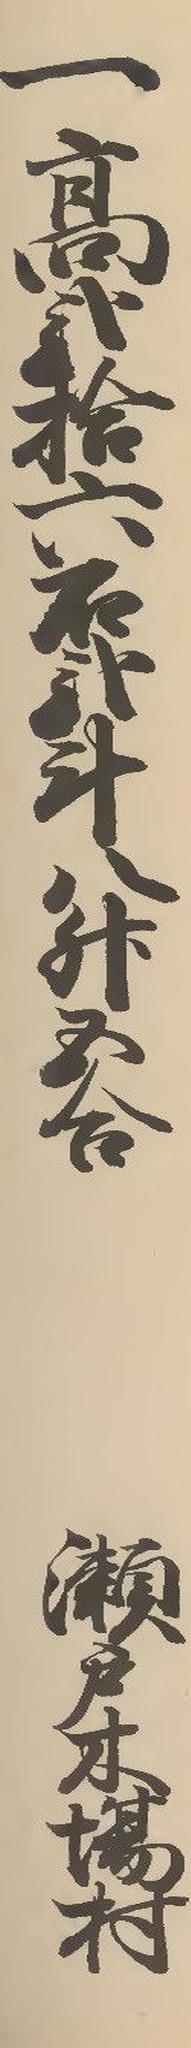一髙弐拾六石弐斗八升五合瀬戸木場村
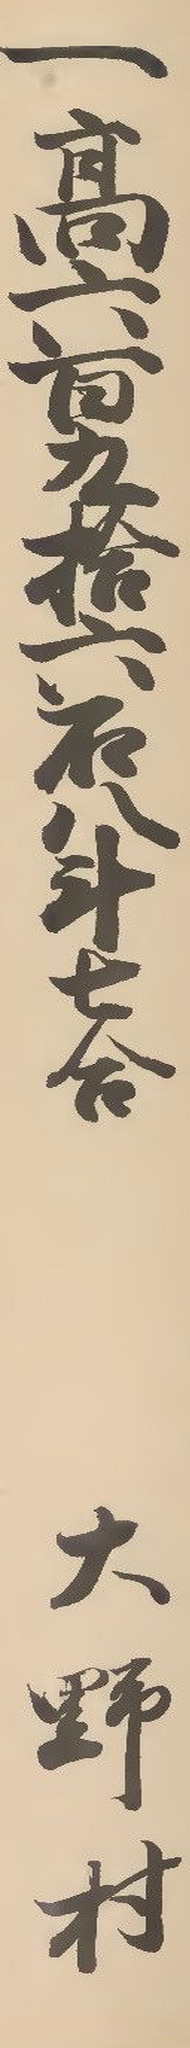一髙六百九拾六石八斗七合大野村
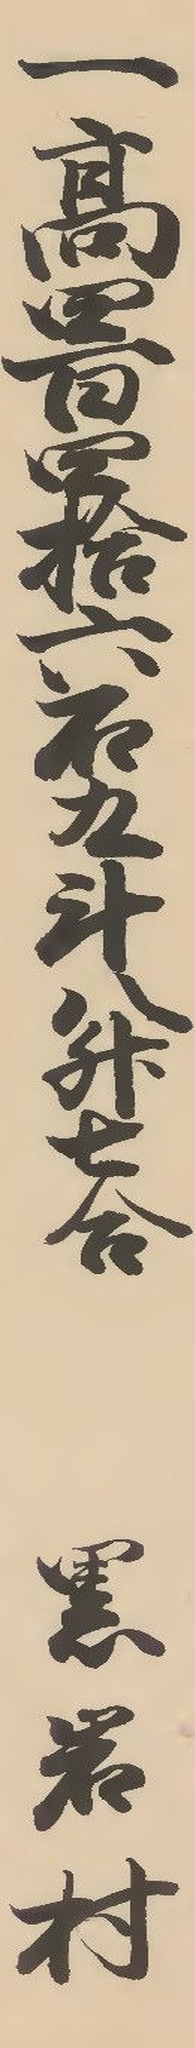一髙四百四拾六石九斗八升七合黑岩村
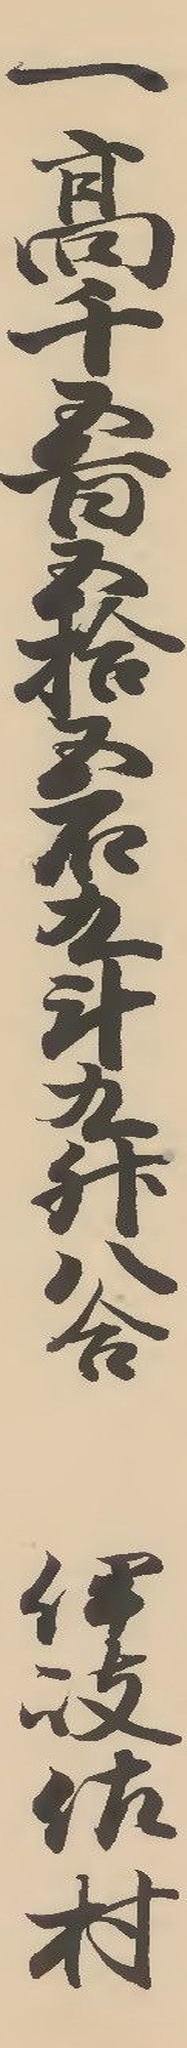一髙千五百五拾五石九斗九升八合伊岐佐村
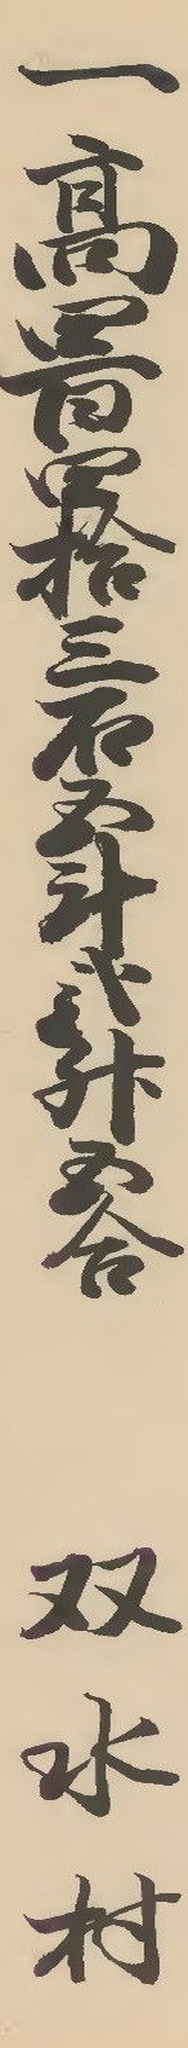一髙四百四拾三石五斗弐升五合双水村

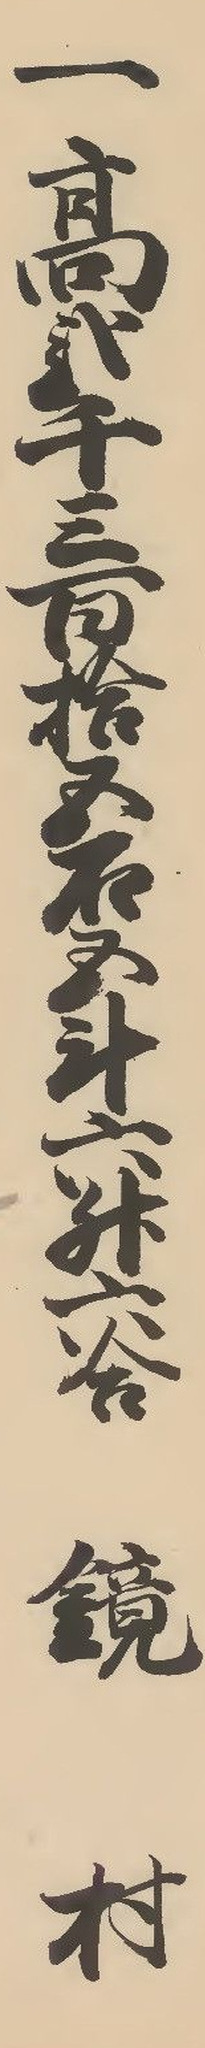一髙弐千三百拾五石五斗六升六合鏡村
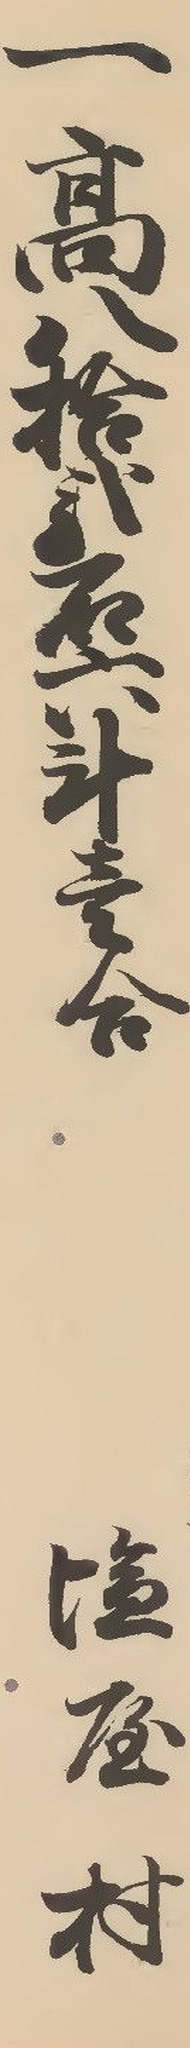一髙八拾弐石六斗壱合塩屋村
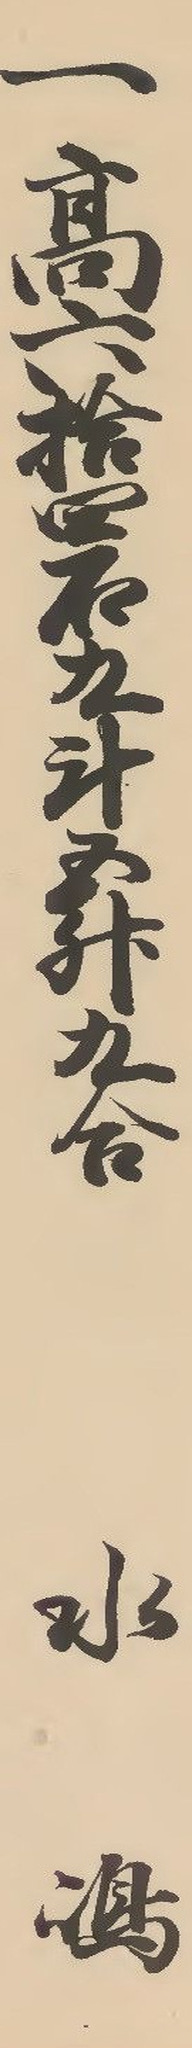一髙六拾四石九斗五升九合水嶋
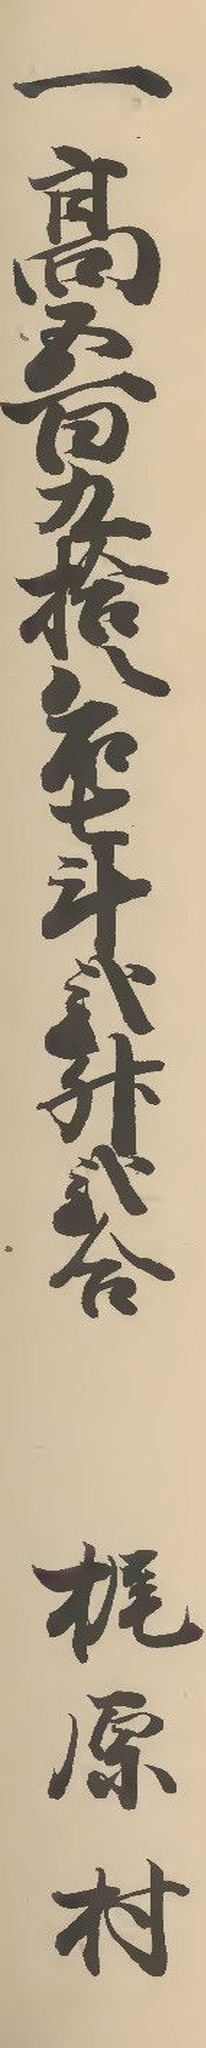一髙五百九拾八石七斗弐升弐号梶原村
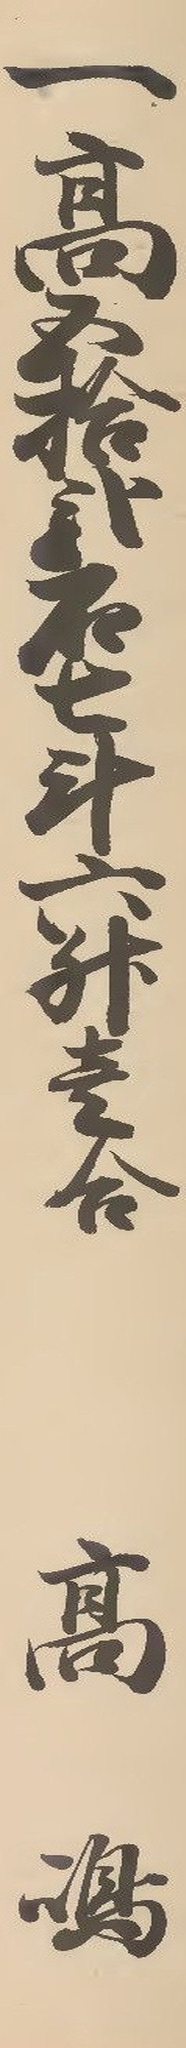一髙五拾弐石七斗六升壱合髙嶋
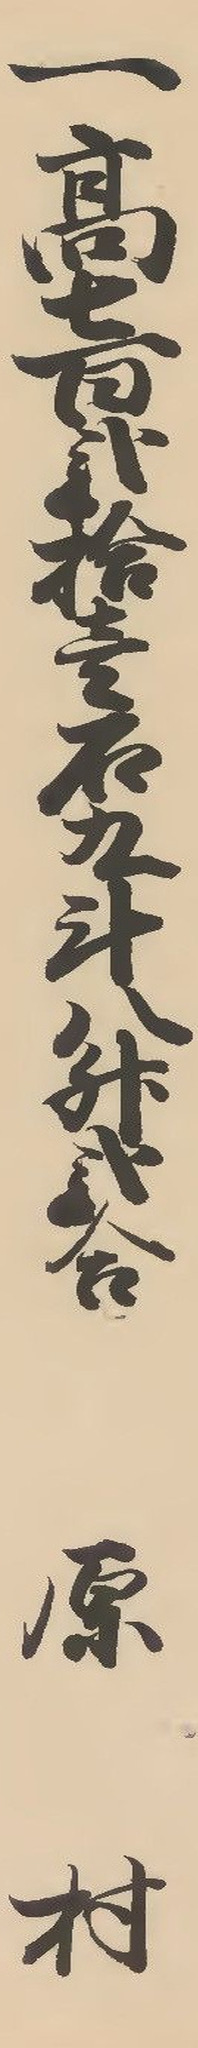一髙七百弐拾壱石九斗八升弐合原村
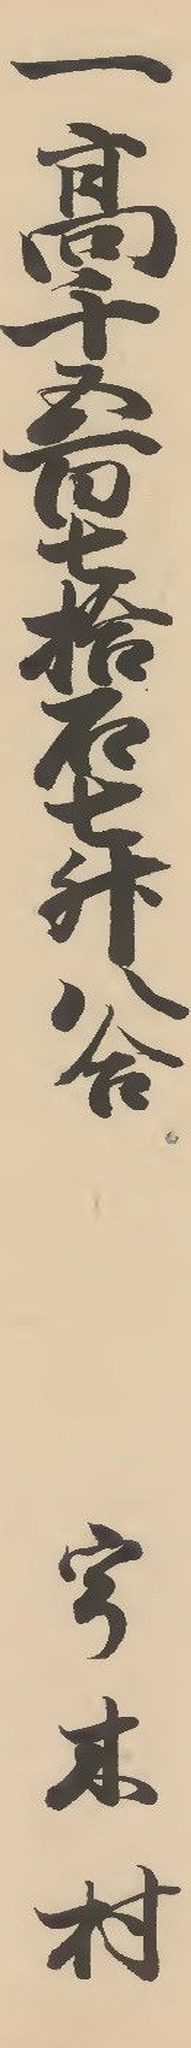一髙千五百七拾石七升八合宇木村
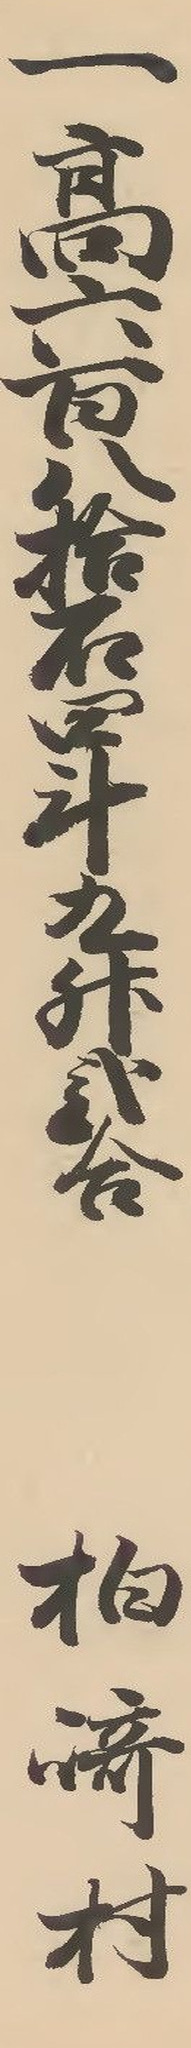一髙六百八拾石四斗九斗弐号柏崎村

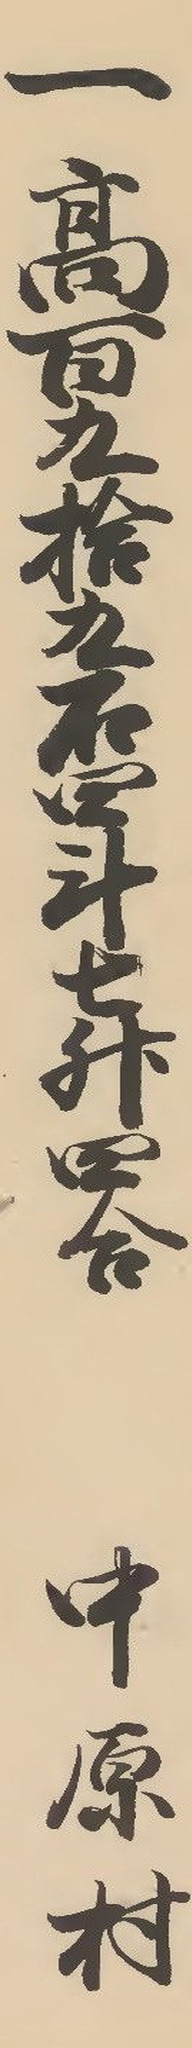一髙百九拾九石四斗七升四合中原村
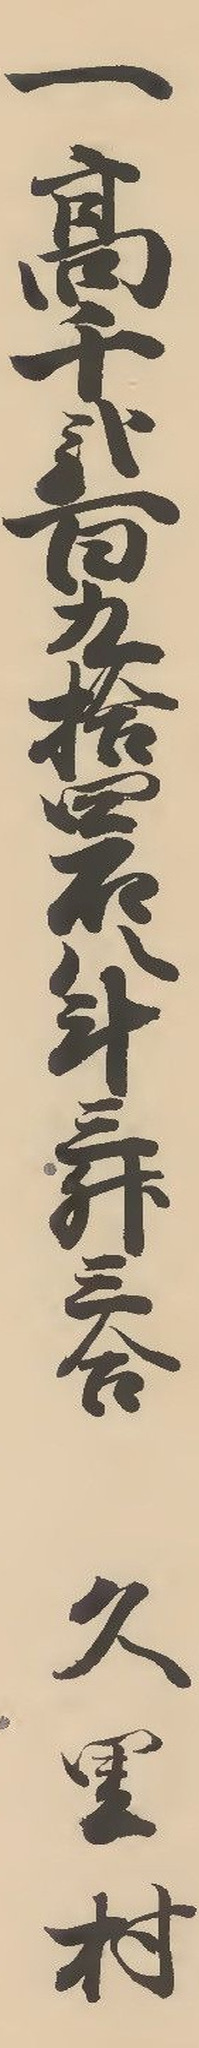一髙千弐百九拾四石八斗三升三合久里村
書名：肥前国郷帳
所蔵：国立公文書館 National Archives of Japan
